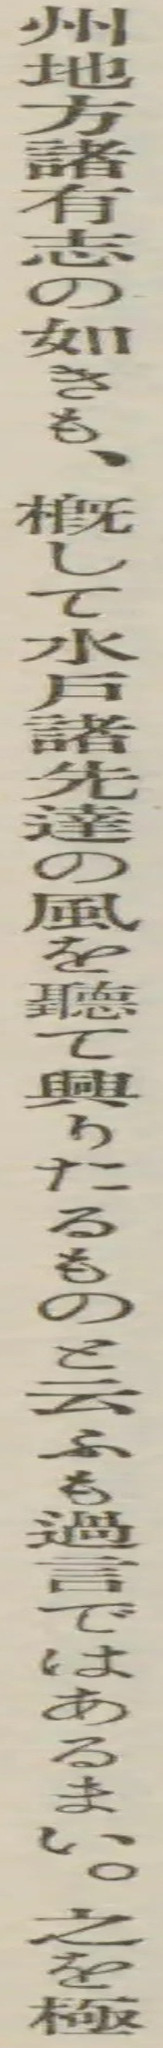州地方諸有志の如きも、概して水戸諸先達の風を聴て興りたるものと云ふも過言ではあるまい。之を極
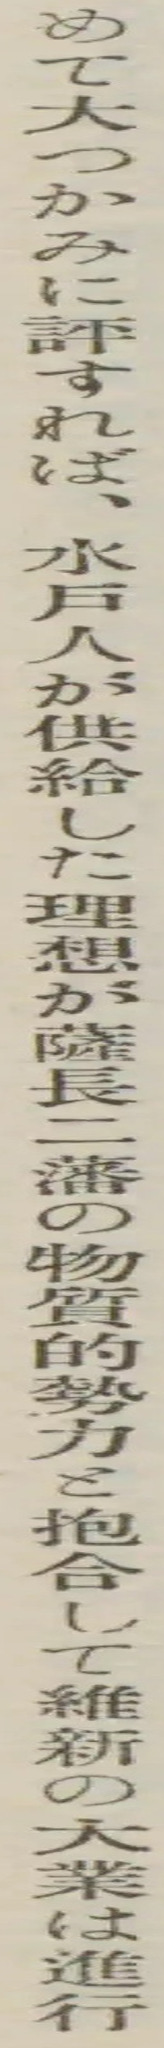めて大つかみに評すれば、水戸人が供給した理想が薩長二藩の物質的勢力と抱合して維新の大業は進行
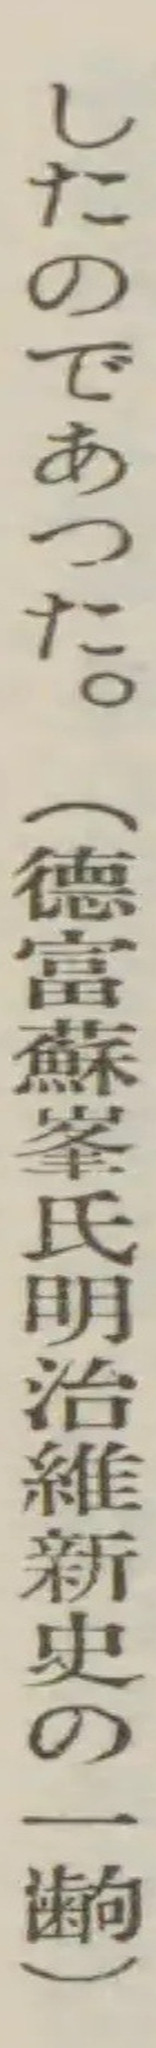したのであつた。(徳富蘇峯氏明治維新史の一齣)
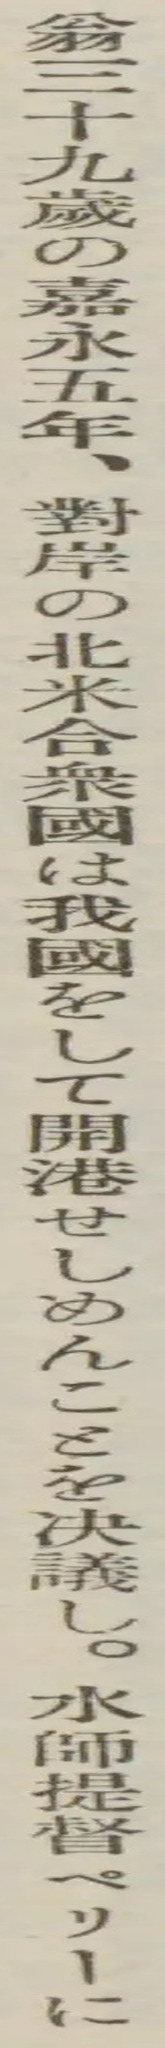翁三十九歳の嘉永五年、対岸の北米合衆国は我国をして開港せしめんことを決議し。水師提督ペリーに
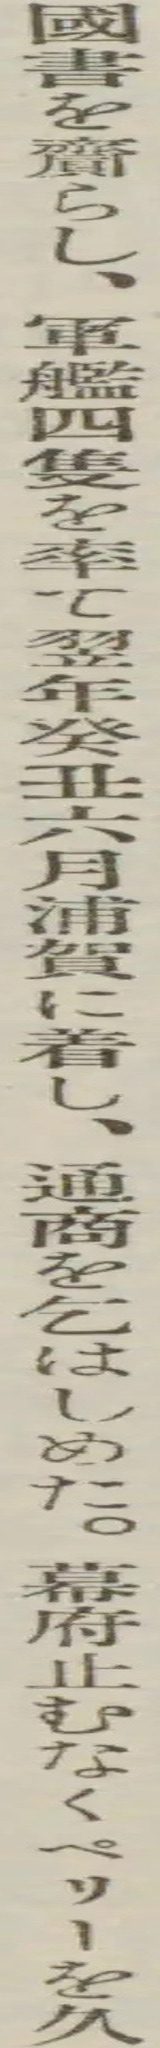国書を齎らし、軍艦四隻を率て翌年癸丑六月浦賀に着し、通商を乞はしめた。幕府止むなくペリーを久
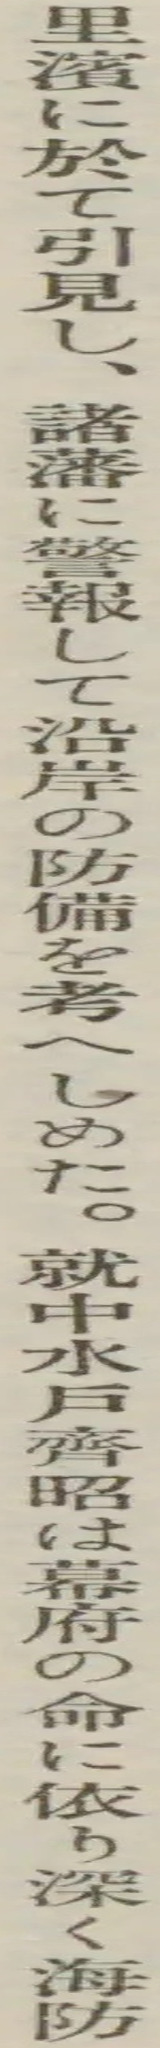里濱に於て引見し、諸藩に警報して沿岸の防備を考へしめた。就中水戸齊昭は幕府の命に依り深く海防
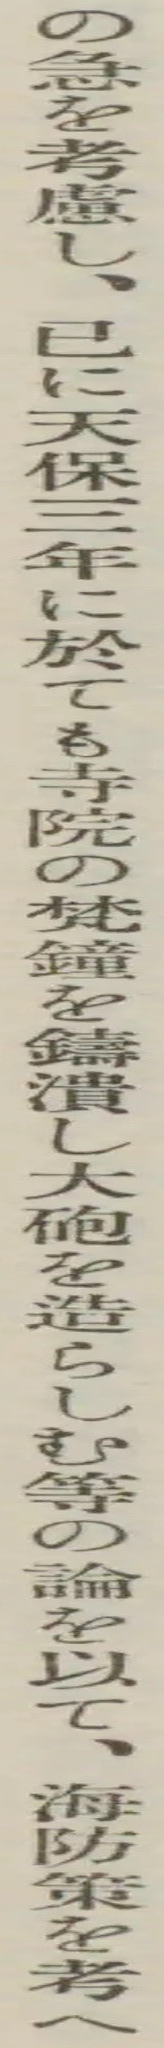の急を考慮し、已に天保三年に於ても寺院の梵鐘を鋳潰し大砲を造らしむ等の論を以て、海防策を考へ
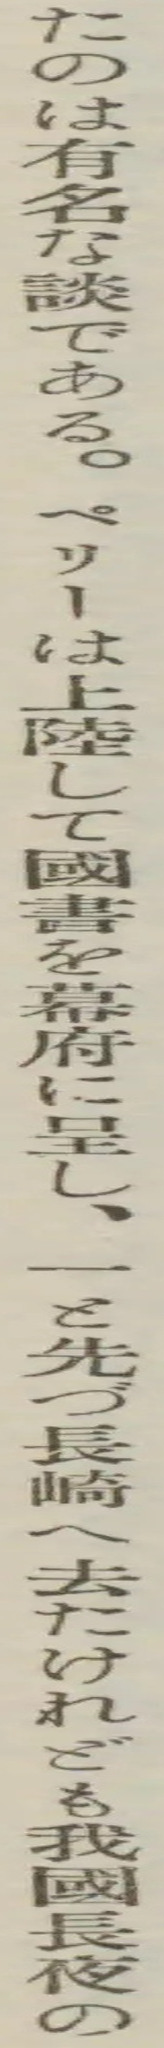たのは有名な談である。ペリーは上陸して国書を幕府に呈し、一と先づ長崎へ去たけれども我国長夜の
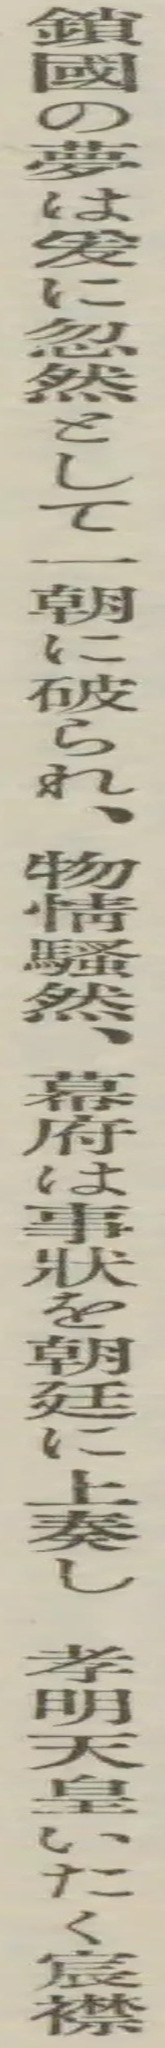鎖国の夢は爰に忽然として一朝に破られ、物情騒然、幕府は事状を朝廷に上奏し孝明天皇いたく宸襟
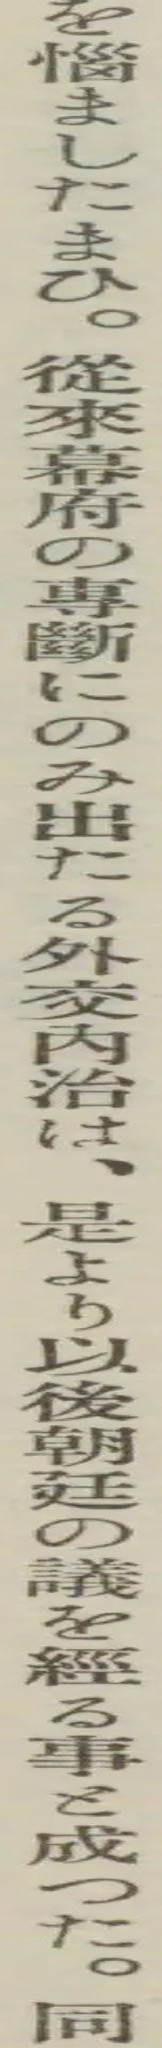を悩ましたまひ。従来幕府の専断にのみ出たる外交内治は、是より以後朝廷の議を経る事と成つた。同
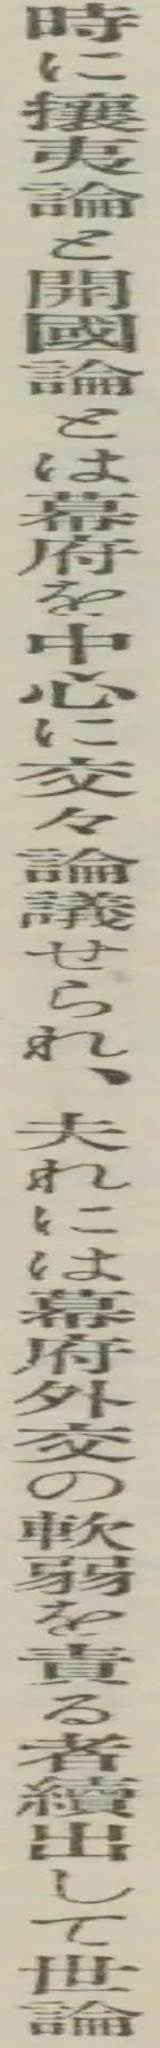時に攘夷論と開国論とは幕府を中心に交々論議せられ、夫れには幕府外交の軟弱を責る者続出して世論
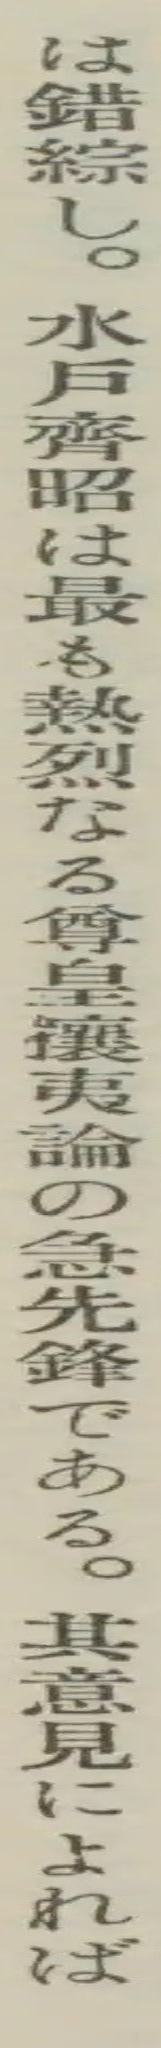は錯綜し。水戸齊昭は最も熱烈なる尊皇攘夷論の急先鋒である。其意見によれば
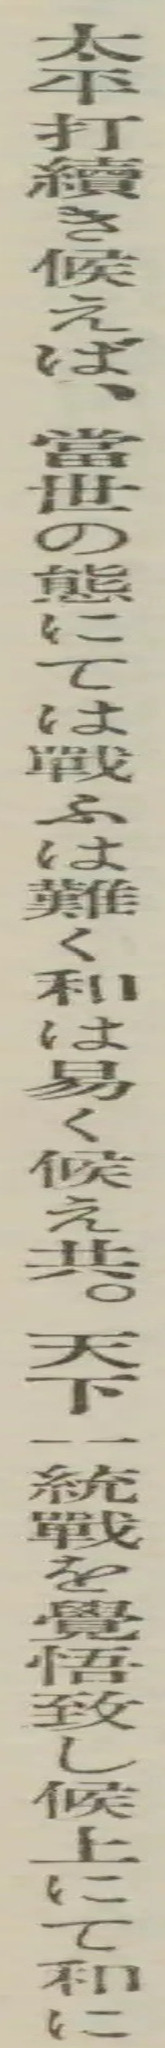太平打続き候えば、当世の態にては戦ふは難く和は易く候え共。天下一統戦を覚悟致し候上にて和に
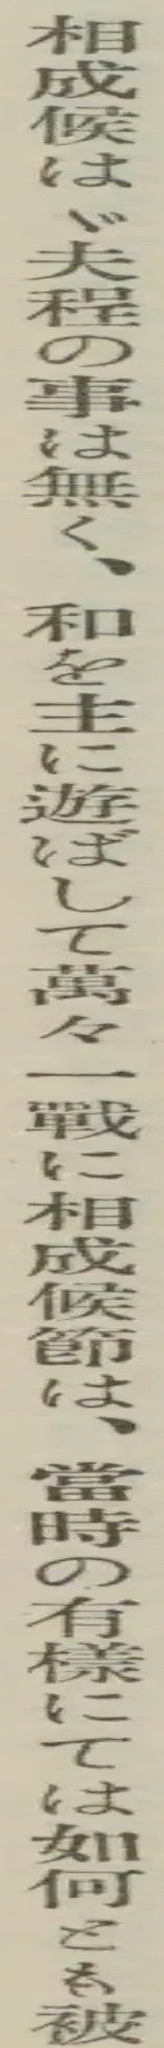相成候はゞ夫程の事は無く、和を主に遊ばして万々一戦に相成候節は、当時の有様にては如何とも被
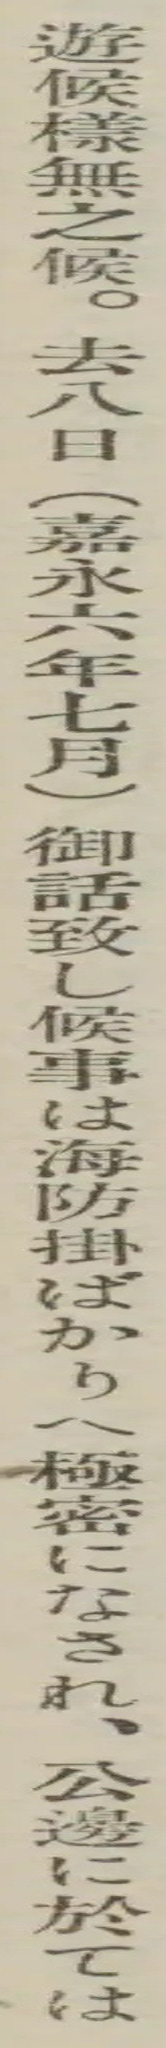遊候様無之候。去八日(嘉永六年七月)御話致し候事は海防掛ばかりへ極密になされ、公辺に於ては
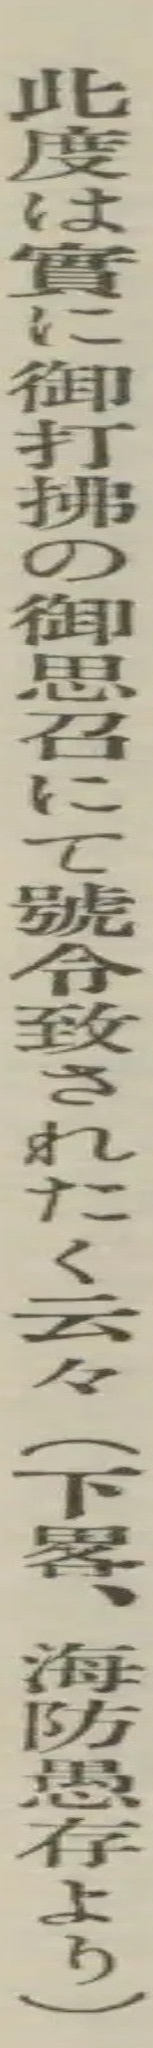此度は実に御打払の御思召にて号令致されたく云々(下略、海防愚存より)
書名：小野湖山翁小伝
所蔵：国立国会図書館 National Diet Library, JAPAN
